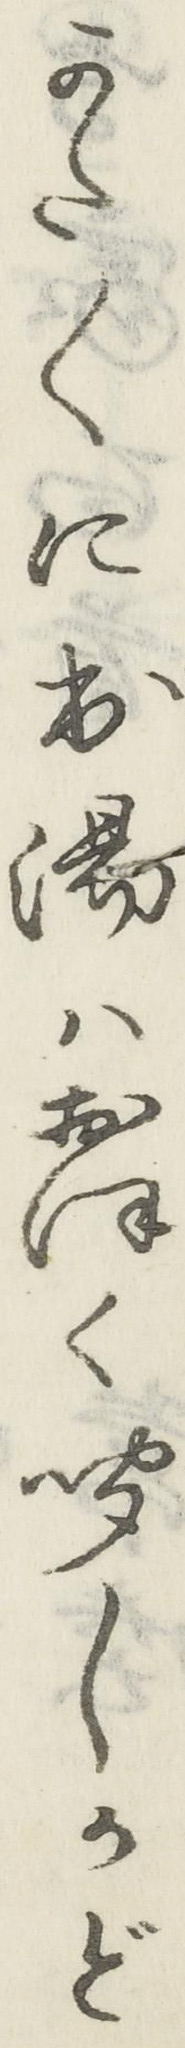かた〳〵に出湯はおほく聞しかど
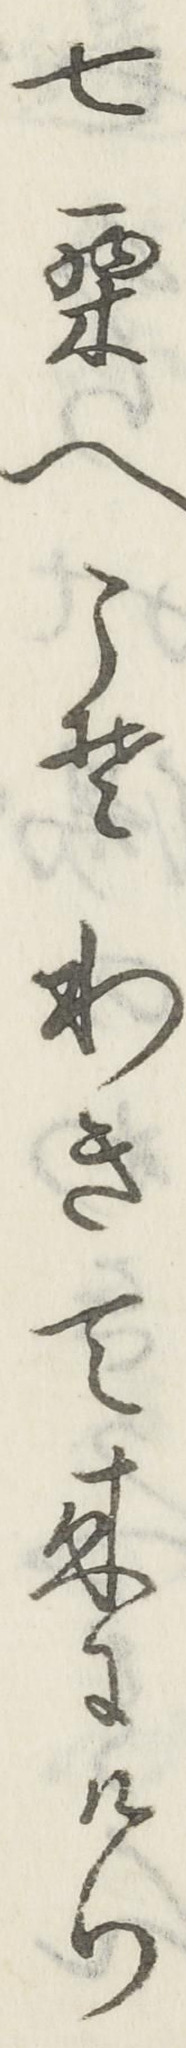七栗へこそわきて来にけり
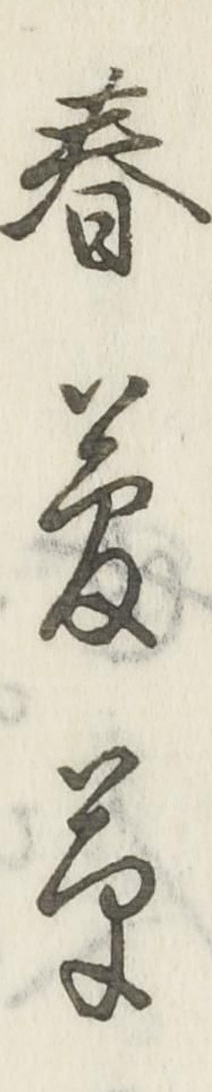春夢草
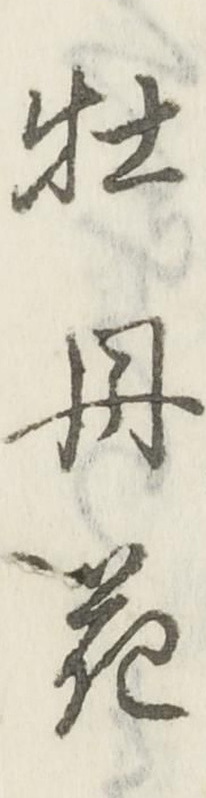牡丹花
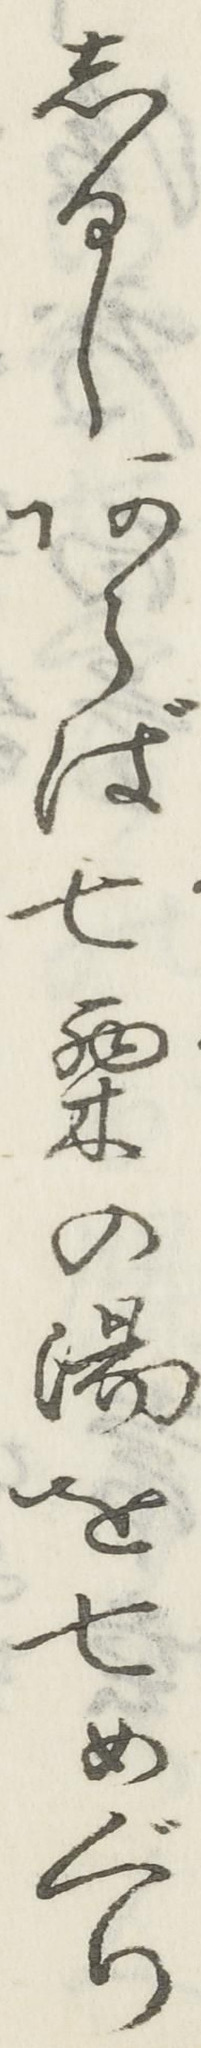しるしあらば七栗の湯を七めぐり
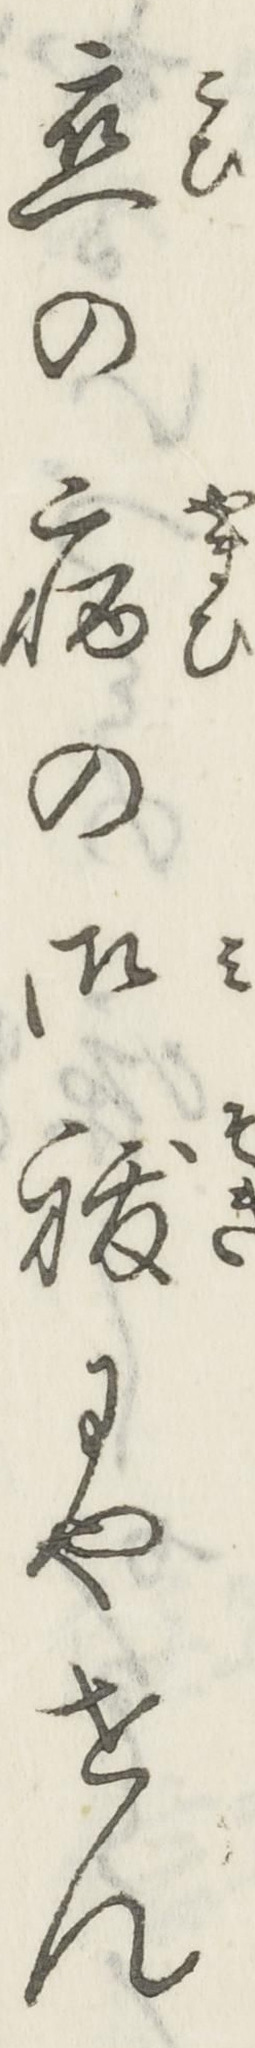恋の病の御祓にやせん
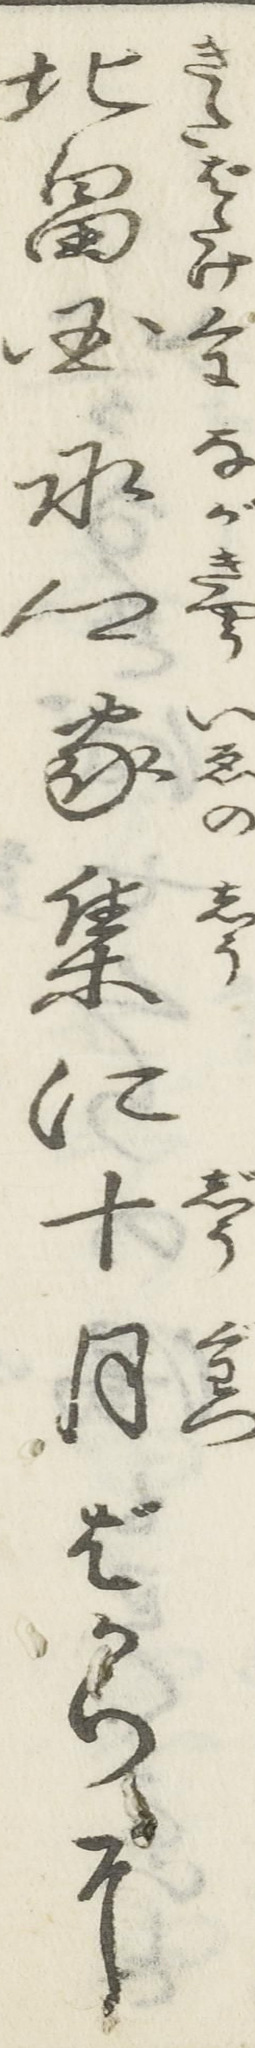北畠国永卿家集に十月ばかりに
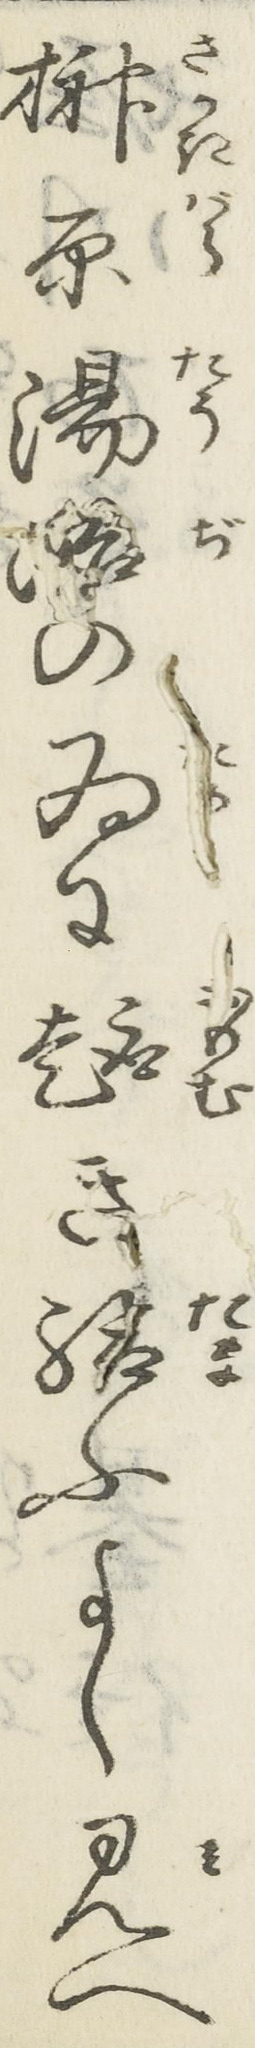榊原湯治の為に趣き給ふよし見へ
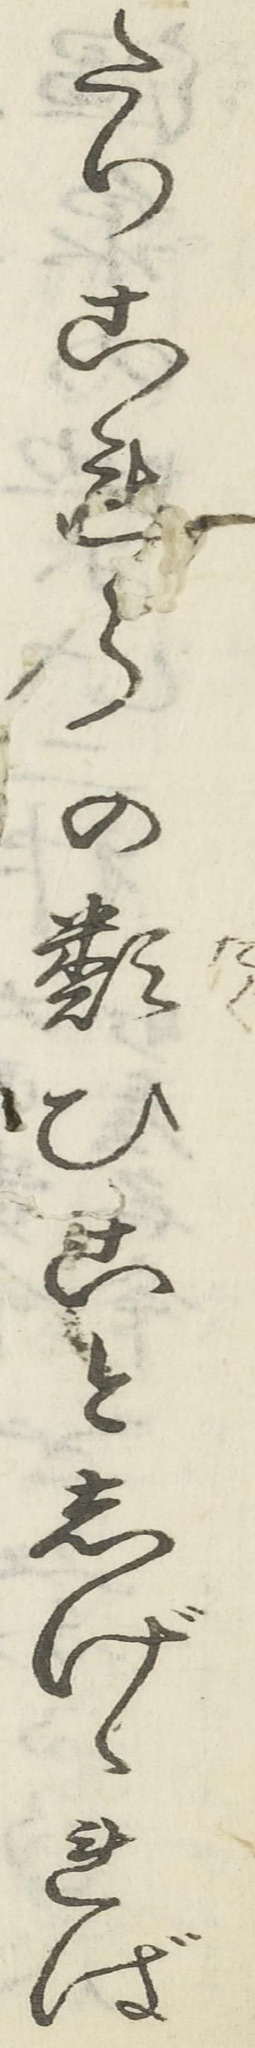たりこれらの類ひことしげゝれば
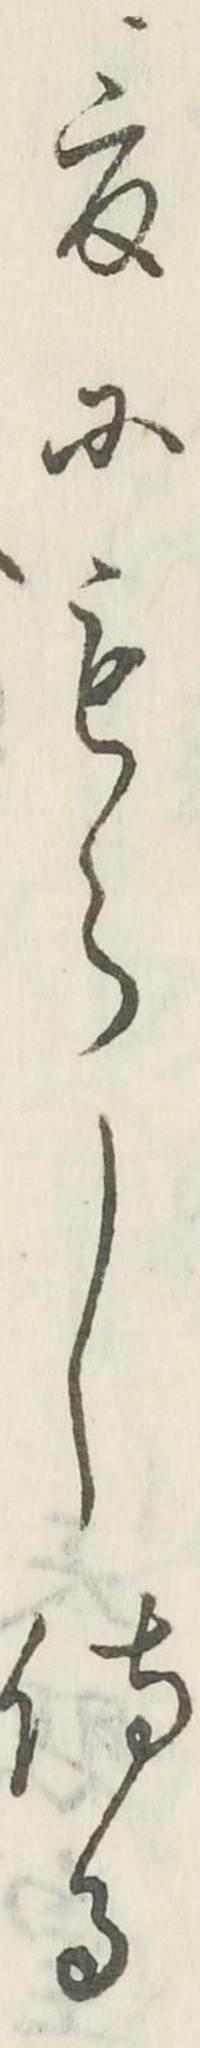爰にもらし侍る
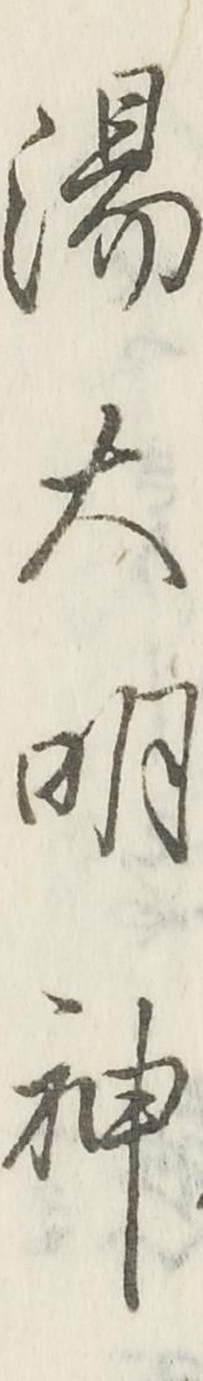湯大明神
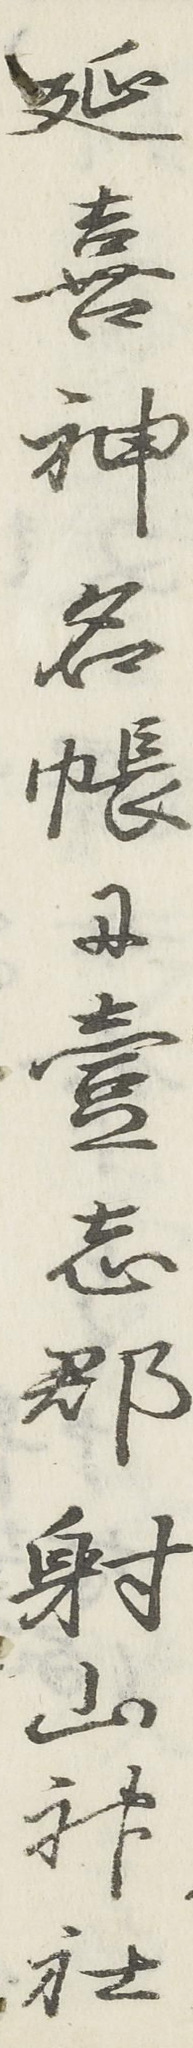延喜神名帳に壱志郡射山神社
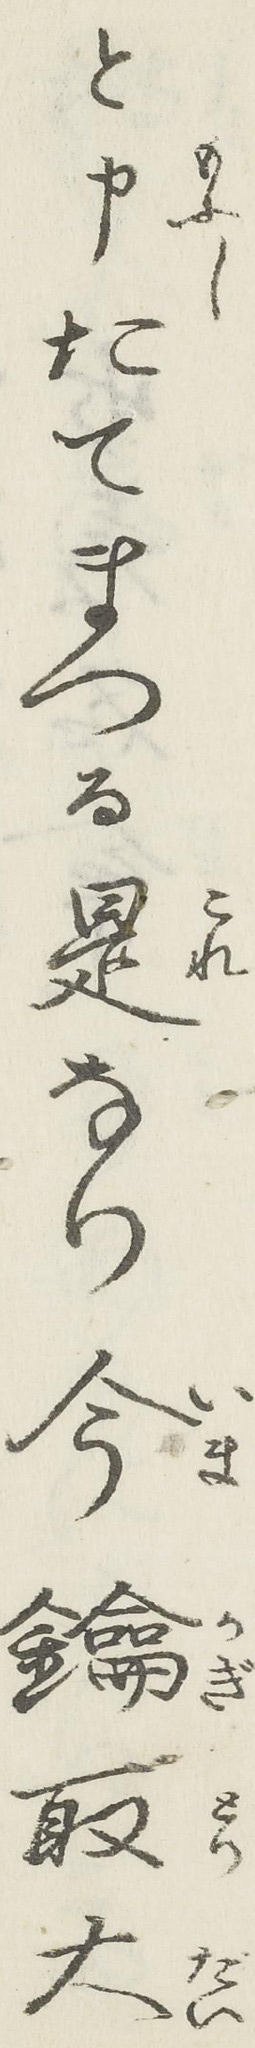と申たてまつる是なり今鑰取大
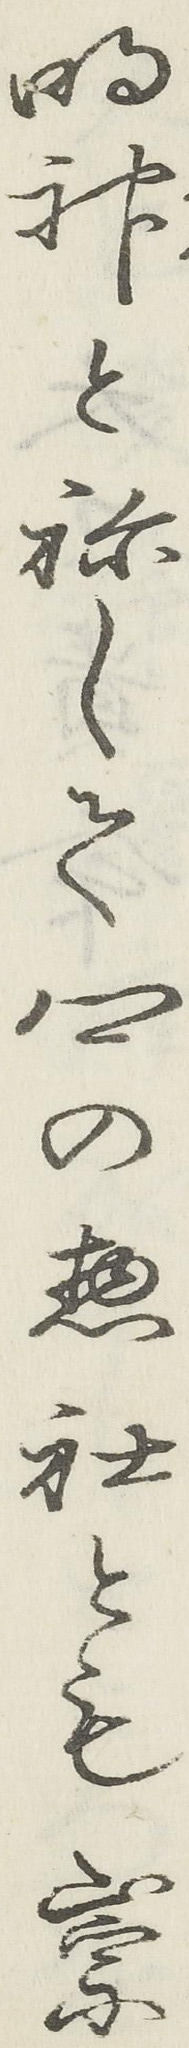明神と称して郷の惣社とも崇

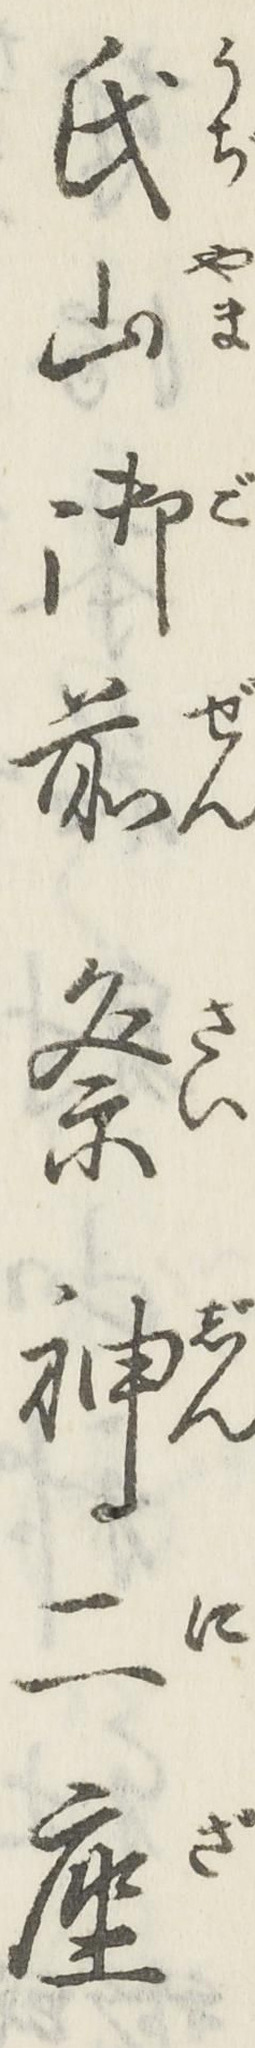氏山御前祭神二座
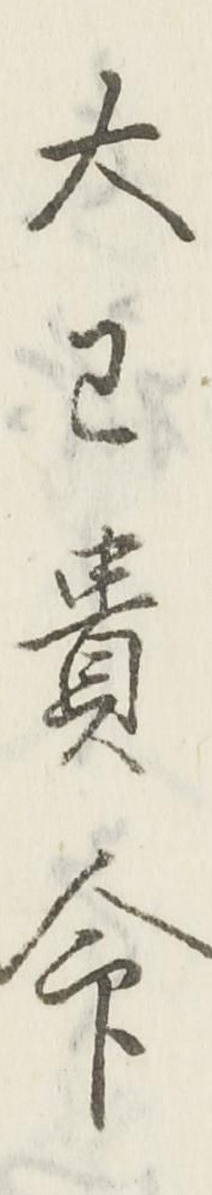大己貴命
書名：温泉来由記
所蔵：東京大学地震研究所図書室 Earthquake Research Institute Library, The University of Tokyo, JAPAN
